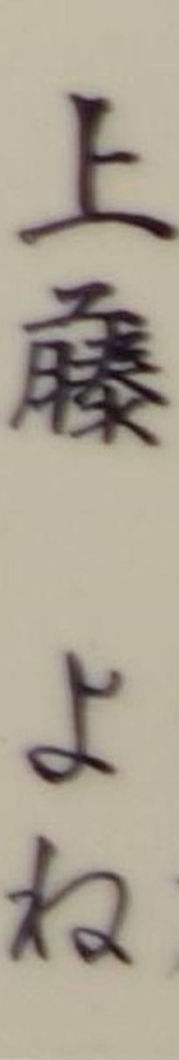上藤よね
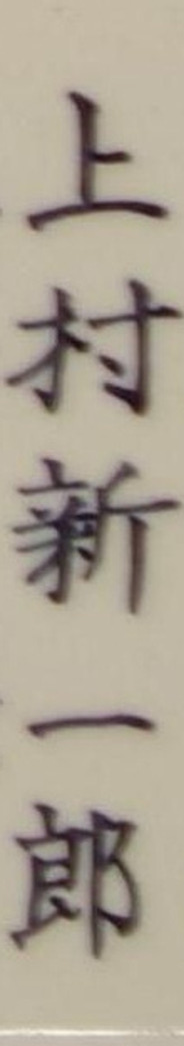上村新一郎
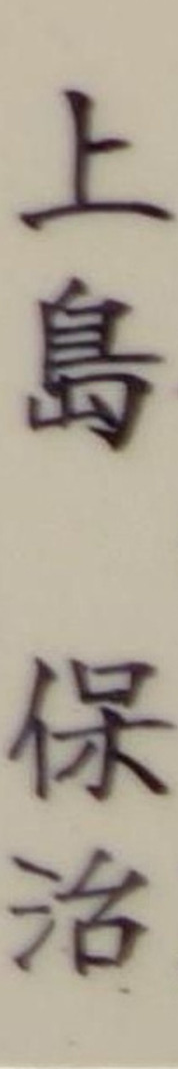上島保治
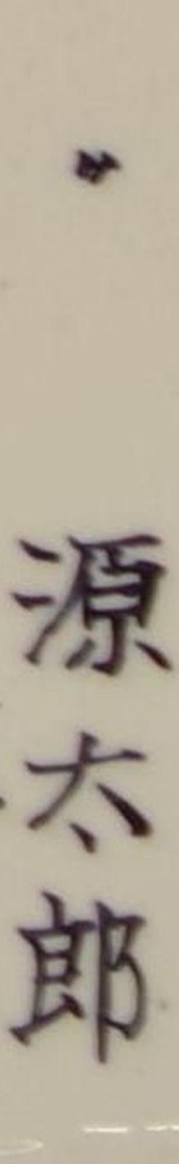源太郎
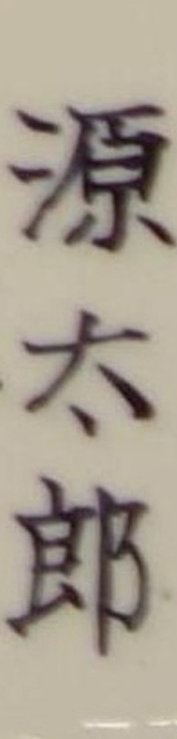源太郎
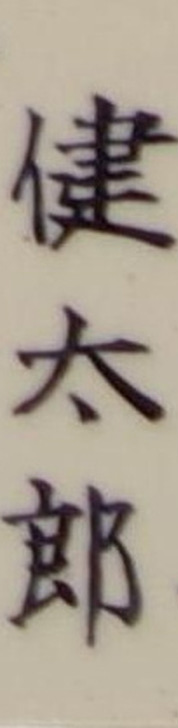健太郎
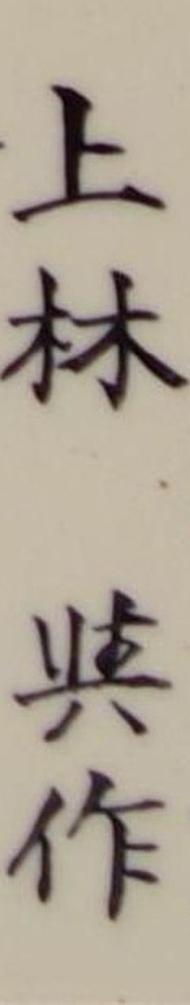上林与作
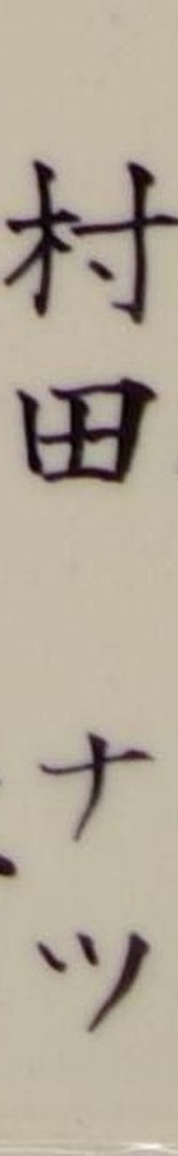村田ナツ
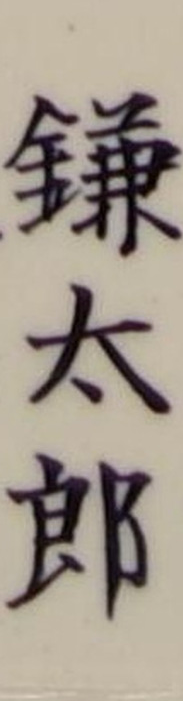鎌太郎
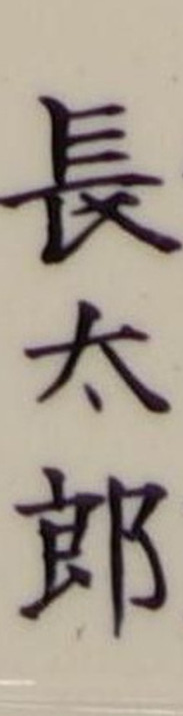長太郎
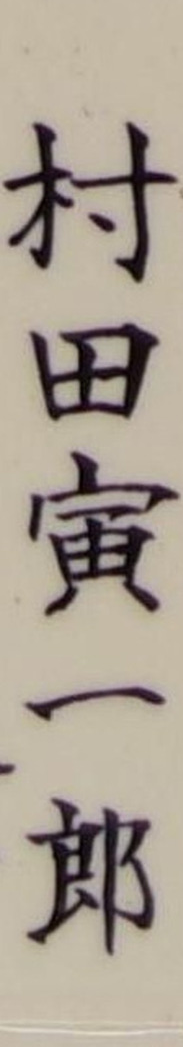村田寅一郎
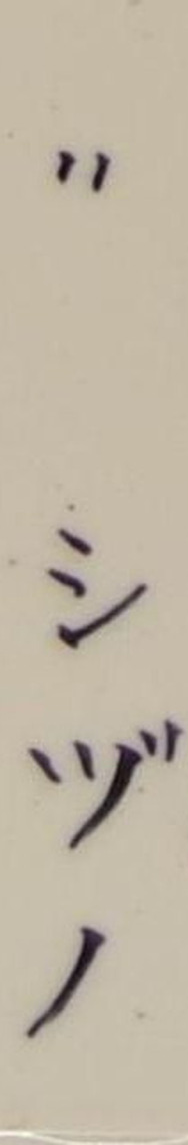シヅノ
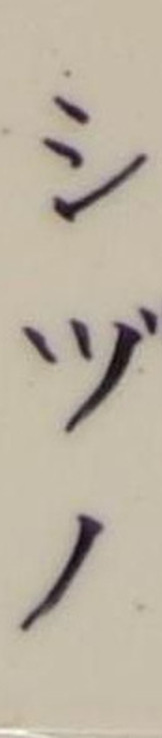シヅノ

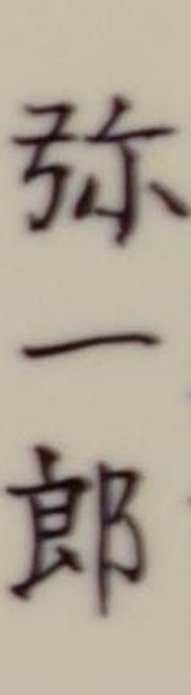弥一郎
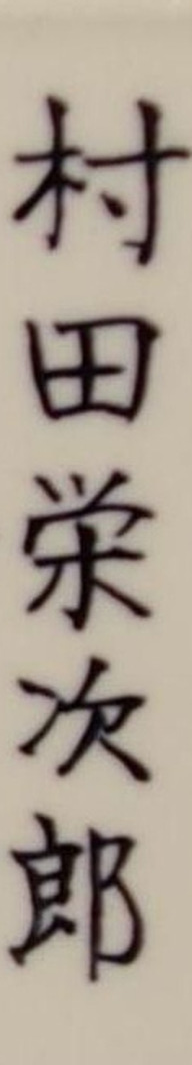村田栄次郎
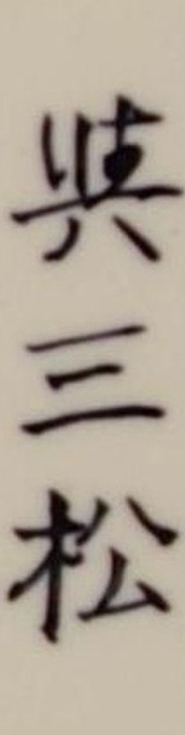与三松
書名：M~S
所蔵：高野山金剛峯寺
